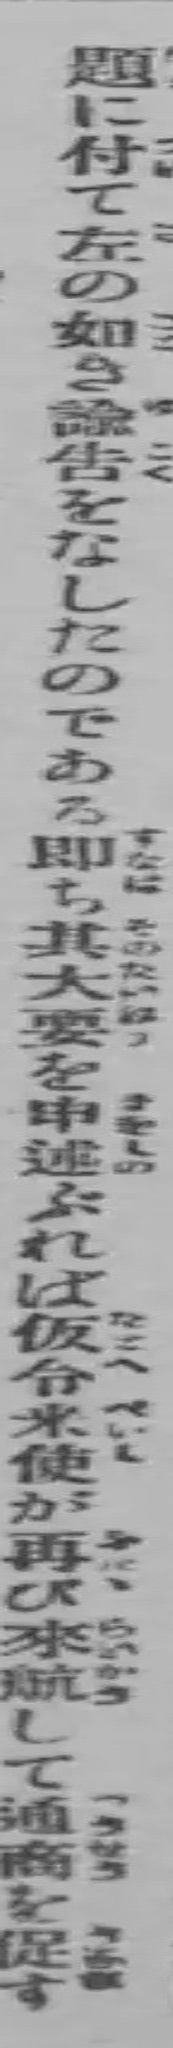題に付て左の如き諭告をなしたのである即ち其大要を申述ぶれば仮令米使が再び来航して通商を促す
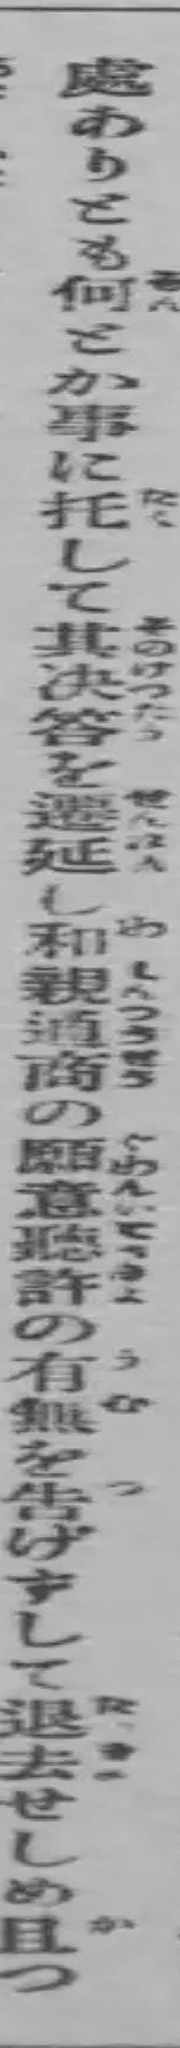処ありとも何とか事に托して其決答を遷延し和親通商の願意聴許の有無を告げずして退去せしめ且つ
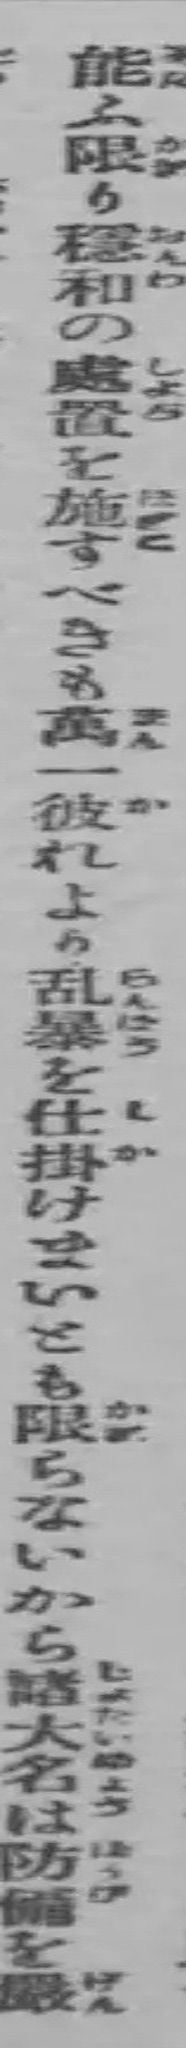能ふ限り穏和の処置を施すべきも万一彼れより乱暴を仕掛けまいとも限らないから諸大名は防備を厳
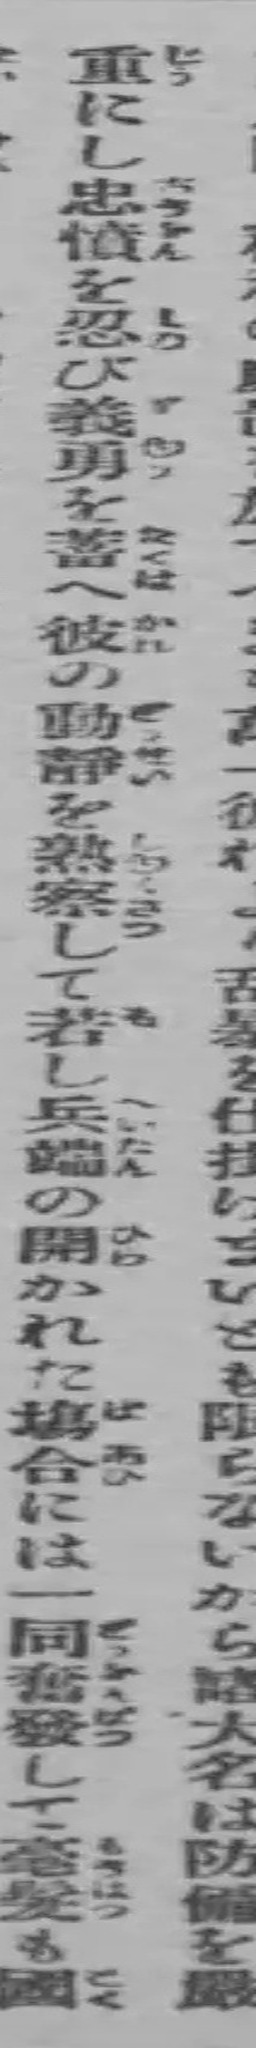重にし忠憤を忍び義勇を蓄へ彼の動静を熟察して若し兵端の開かれた場合には一同奮発して毫髪も国
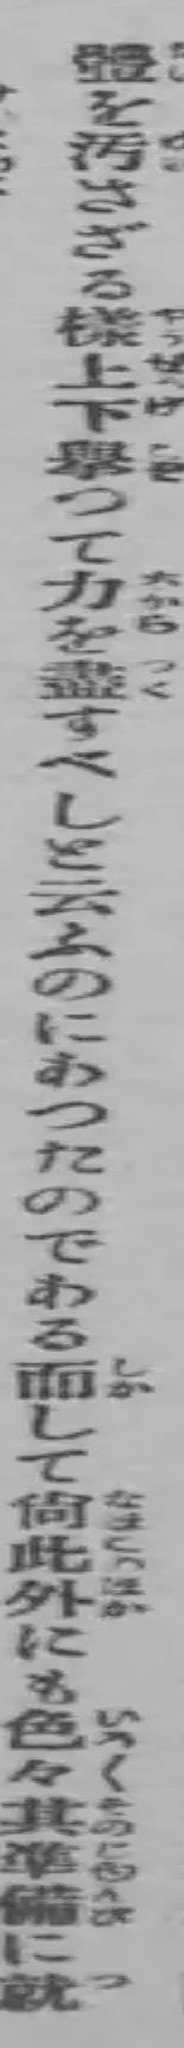體を汚さざる様上下挙つて力を尽すべしと云ふのにあつたのである而して尚此外にも色々其準備に就
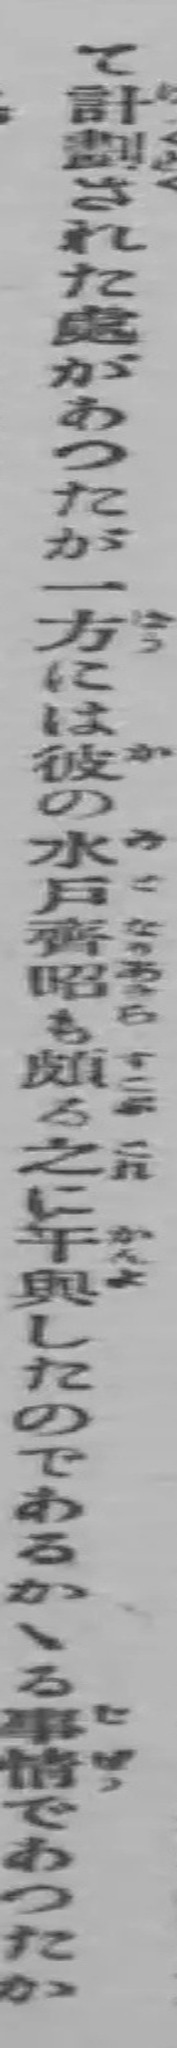て計劃された処があつたが一方には彼の水戸斉昭も頗る之に干与したのであるかゝる事情であつたか
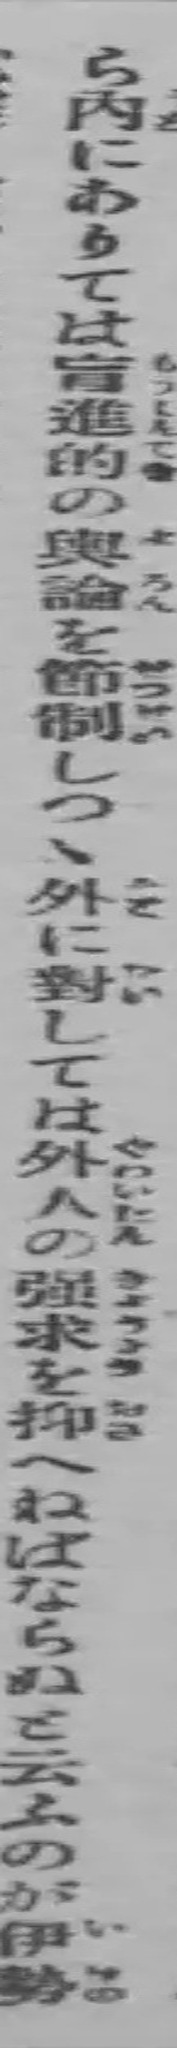ら内にありては盲進的の与論を節制しつゝ外に対しては外人の強求を抑へねばならぬと云ふのが伊勢
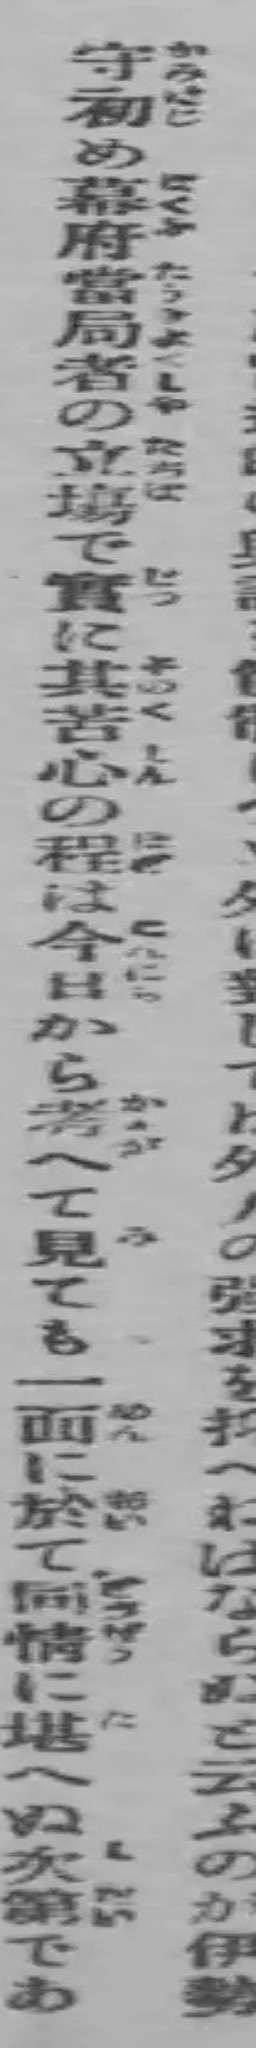守初め幕府当局者の立場で実に其苦心の程は今日から考へて見ても一面に於て同情に堪へぬ次第であ
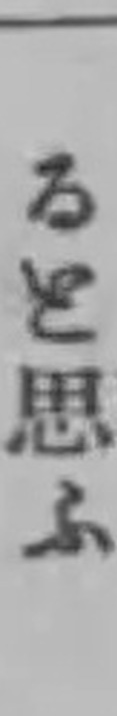ると思ふ
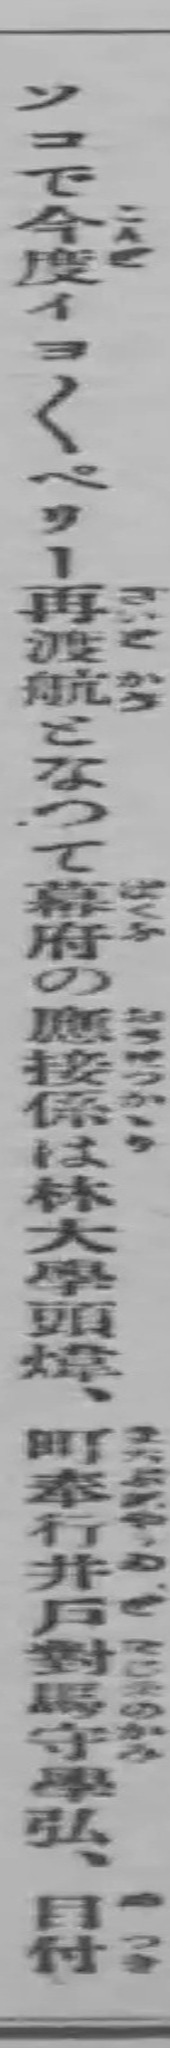ソコで今度イヨ〳〵ペリー再渡航となつて幕府の応接係は林大学頭煒、町奉行井戸対馬守学弘、目付
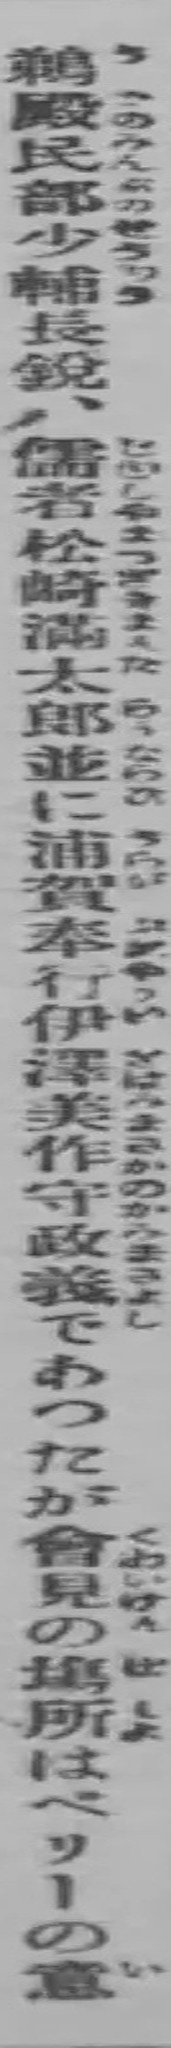鵜殿民部少輔長鋭、儒者松崎満太郎並に浦賀奉行伊沢美作守政義であつたが会見の場所はペリーの意
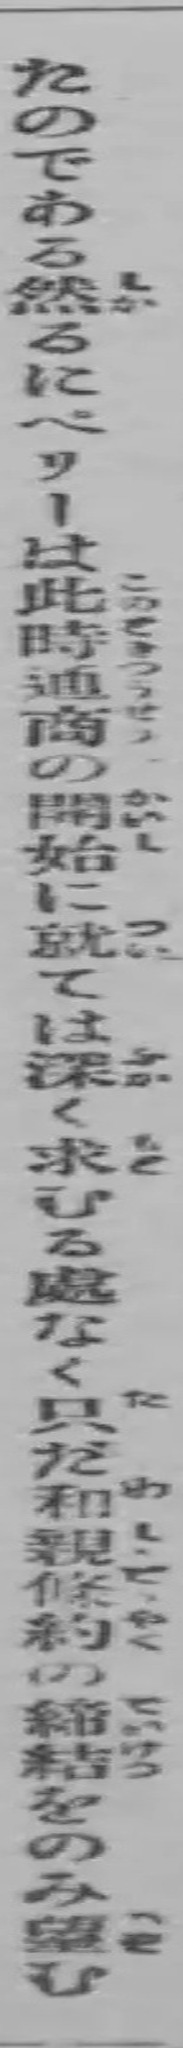たのである然るにペリーは此時通商の開始に就ては深く求むる処なく只だ和親条約の締結をのみ望む
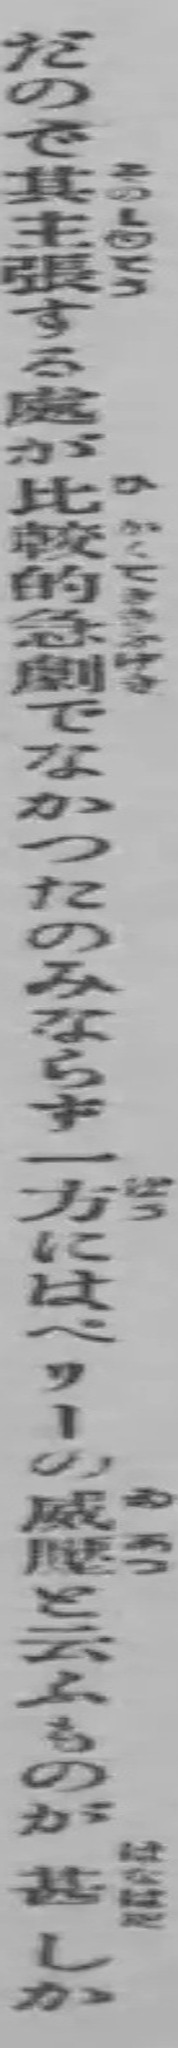だので其主張する処が比較的急劇でなかつたのみならず一方にはペリーの威圧と云ふものが甚しか
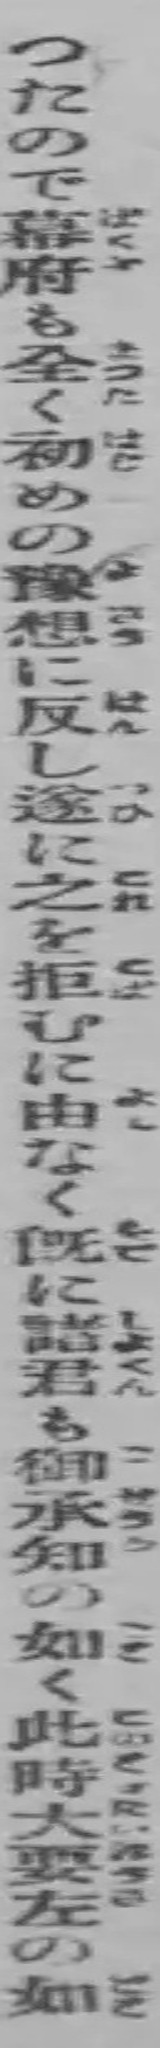つたので幕府も全く初めの予想に反し遂に之を拒むに由なく既に諸君も御承知の如く此時大要左の如
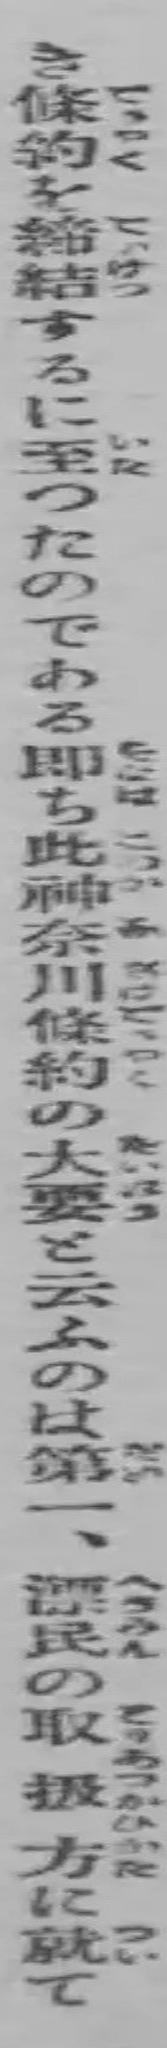き条約を締結するに至つたのである即ち此神奈川条約の大要と云ふのは第一、漂民の取扱方に就て
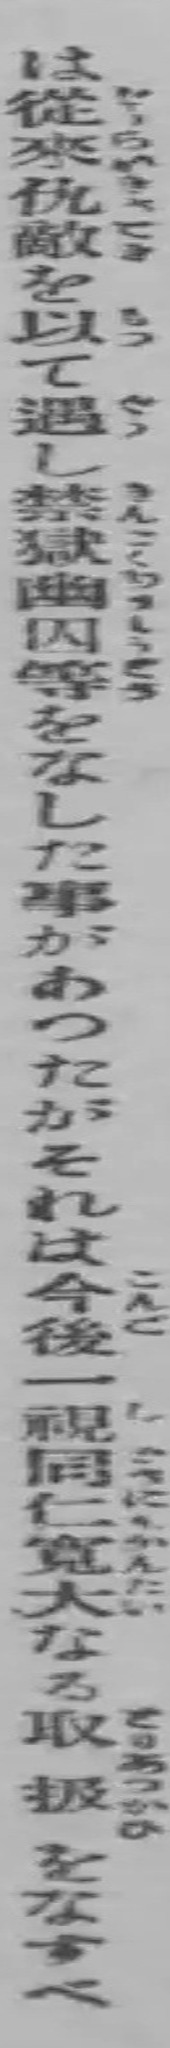は従来仇敵を以て遇し禁獄幽囚等をなした事があつたがそれは今後一親同仁寛大なる取扱をなすべ
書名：豊橋市史談
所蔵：国立国会図書館 National Diet Library, JAPAN
